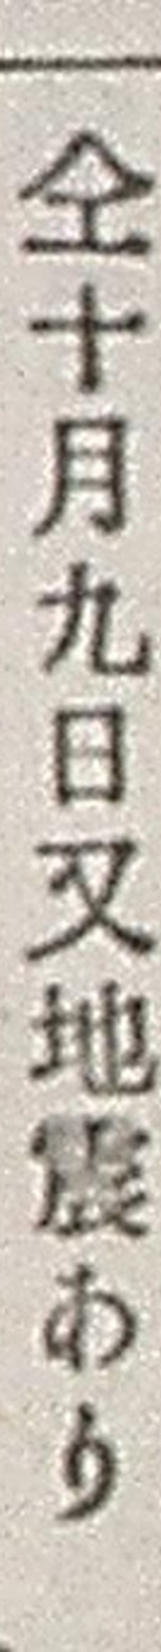仝十月九日又地震あり
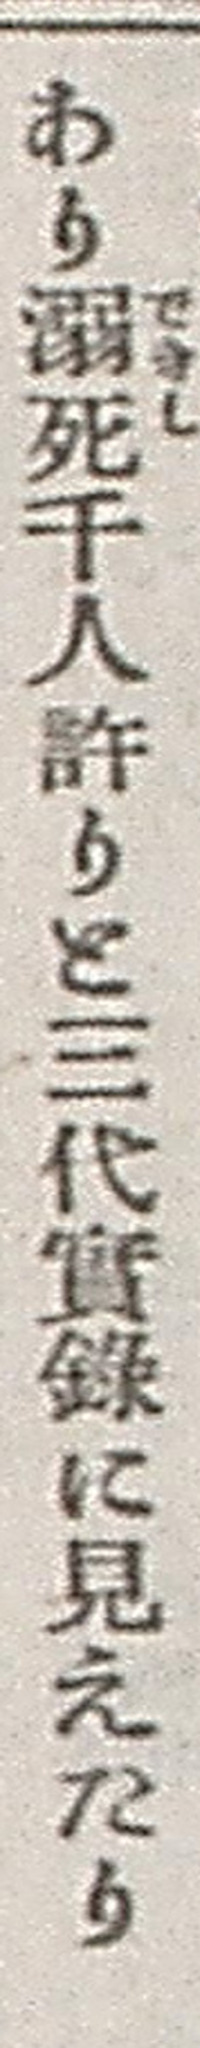あり溺死千人許りと三代実録に見えたり
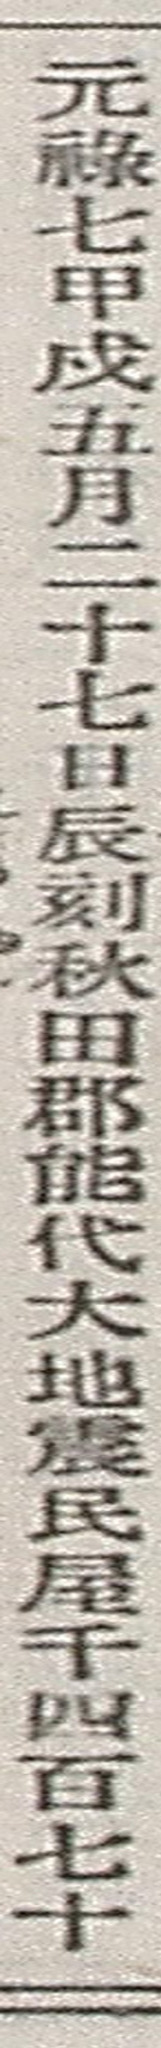元禄七甲戌五月二十七日辰刻秋田郡能代大地震民屋千四百七十
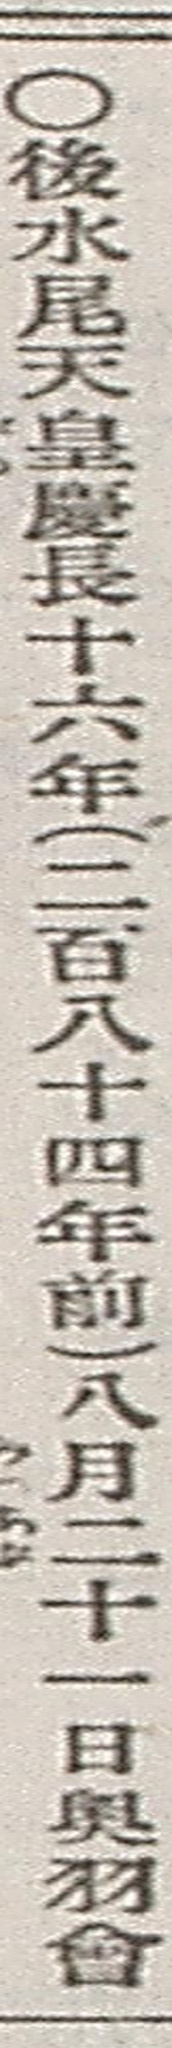〇後水尾天皇慶長十六年八月ニ十一日奥羽会
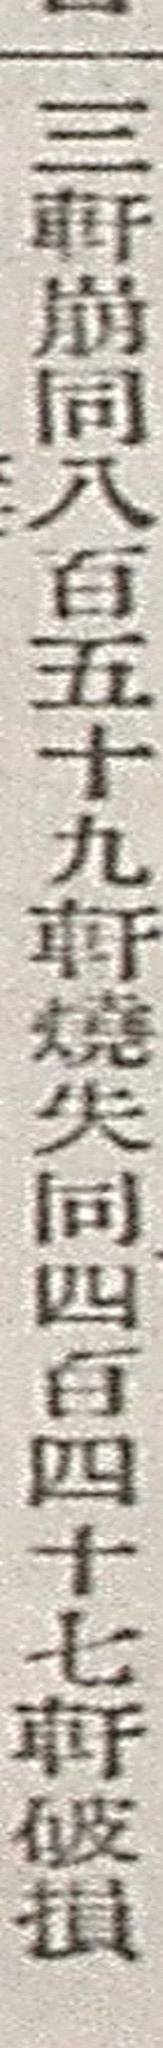三軒崩同八百五十九軒焼失同四百四十七軒破損
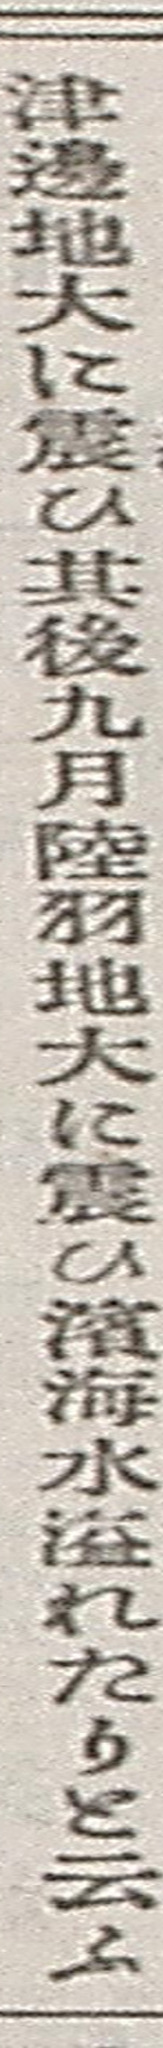津辺地大に震ひ其後九月陸羽地大に震ひ浜海水溢れたりと云ふ
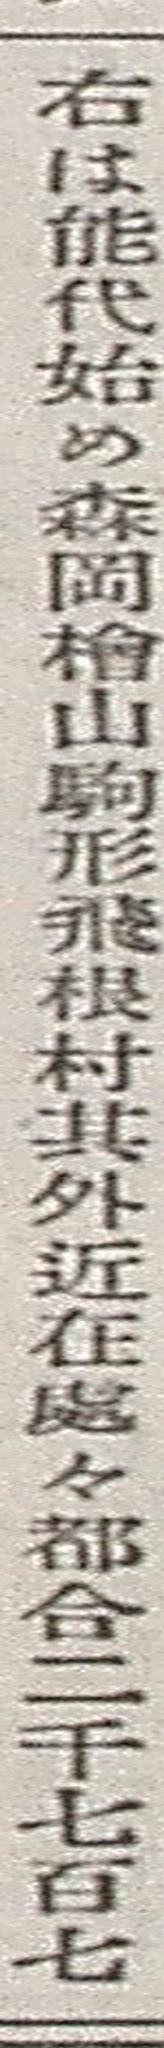右は能代始め森岡檜山駒形飛根村其外近在処々都合二千七百七
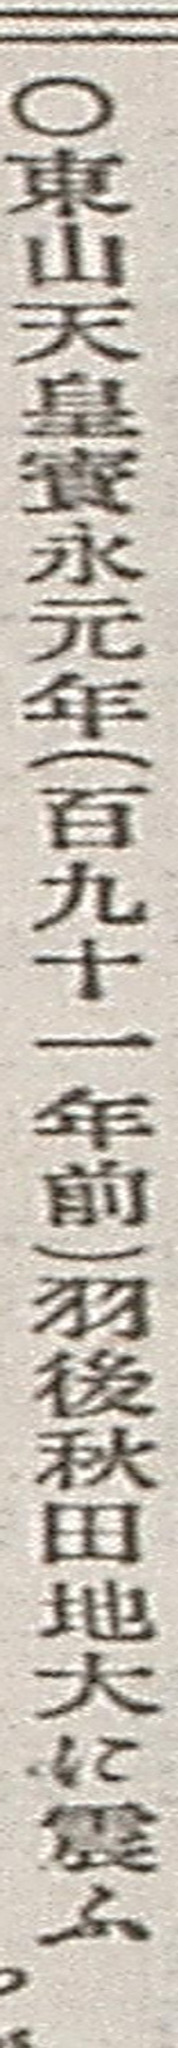〇東山天皇宝永元年羽後秋田地大に震ふ
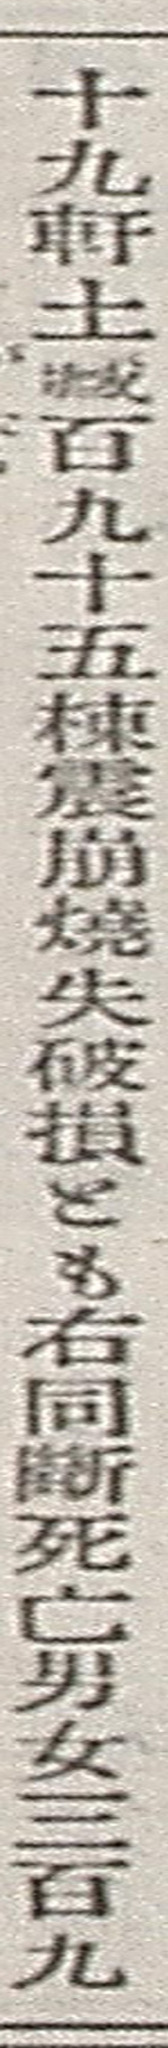十九軒土蔵百九十五棟震崩焼失破損とも右同断死亡男女三百九
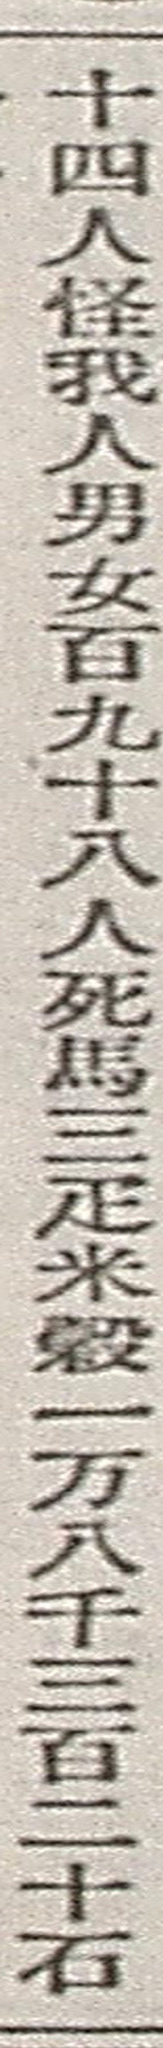十四人怪我人男女百九十八人死馬三疋米穀一万八千三百二十石
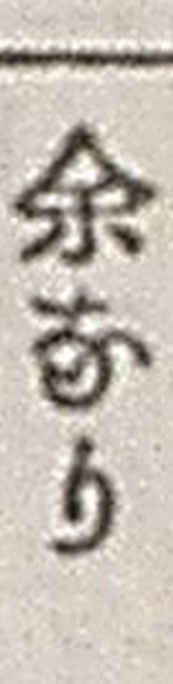余なり
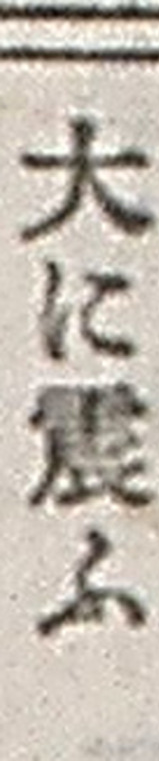大に震ふ
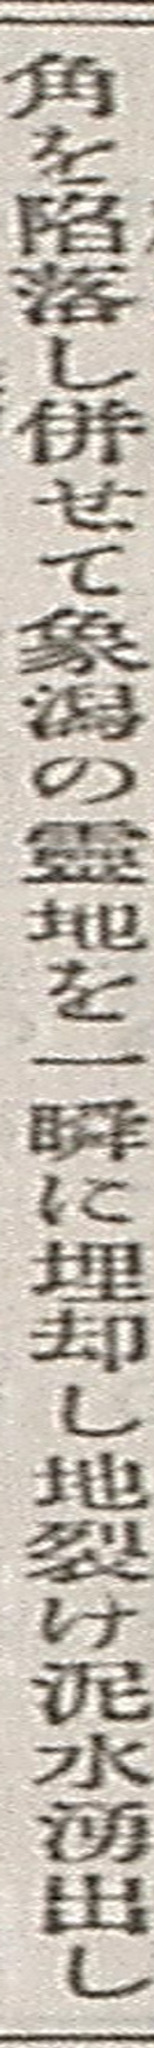角を陥落し併せて象潟の霊地を一瞬に埋却し地裂け泥水湧出し
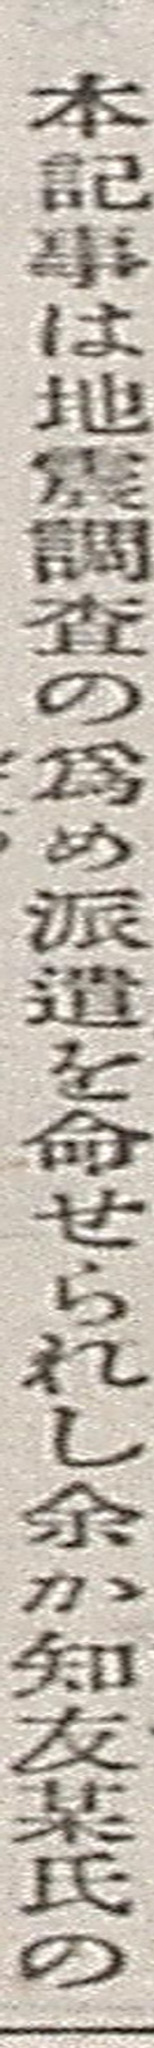本記事は地震調査の為め派遣を命せられし余か知友某氏の
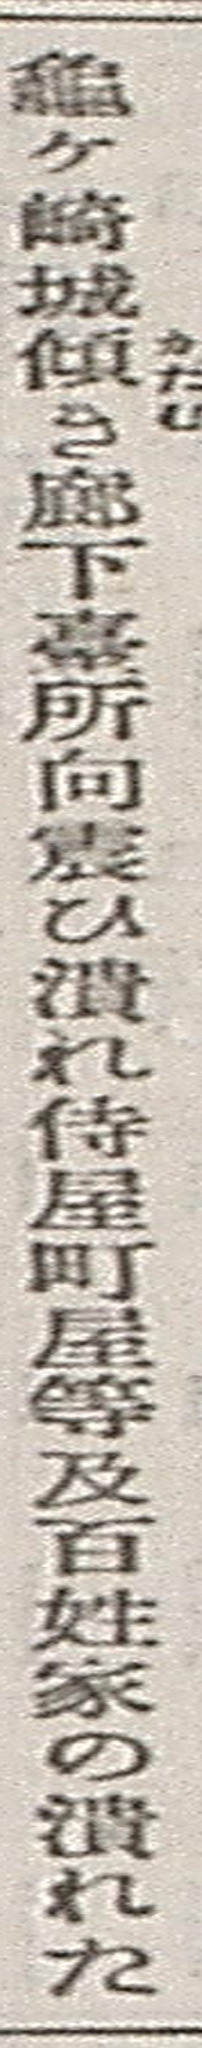亀ケ崎城傾き廊下台所向震ひ潰れ侍屋町屋等百姓家の潰れた
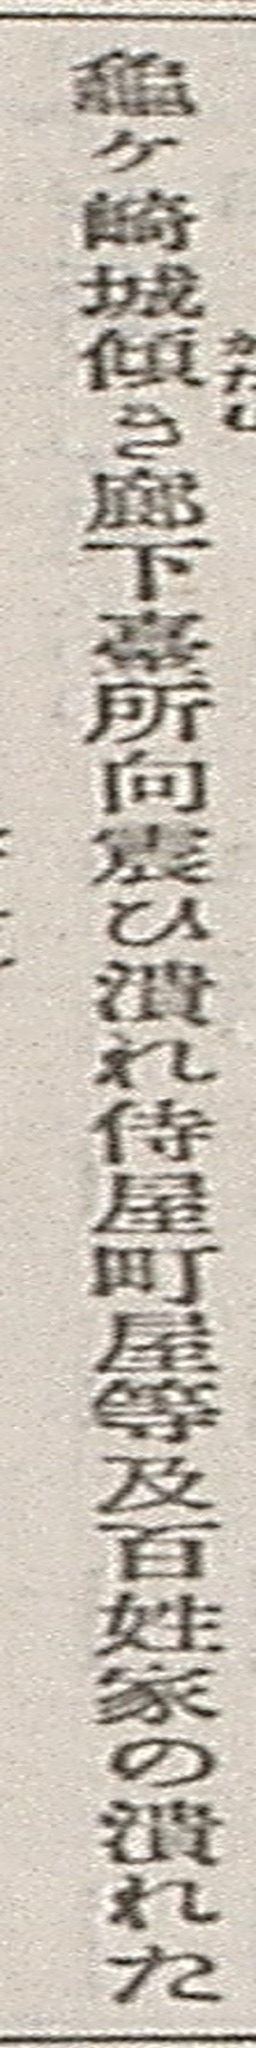亀ケ崎城傾き廊下台所向震ひ潰れ侍屋町屋等百姓家の潰れた
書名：風俗畫報臨時増刊第百二十四號　洪水地震被害録（上）
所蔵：東京大学地震研究所図書室 Earthquake Research Institute Library, The University of Tokyo, JAPAN
